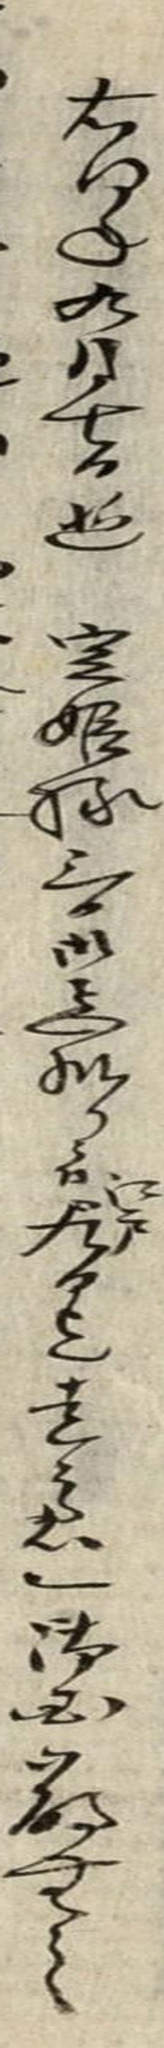右同年九月七日逝定姫様三日御忌掛りに付◦九江戸日迄遠慮」御国御触無之
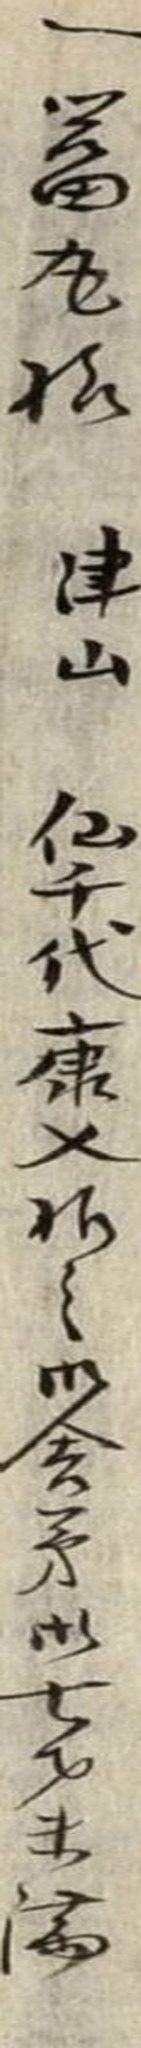一富丸様津山仙千代康乂様之御舎弟御七才未満
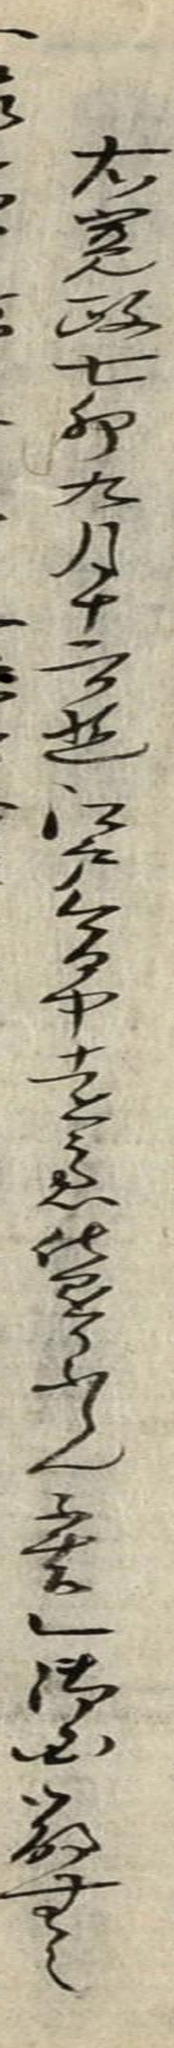右寛政七卯九月十二日逝江戸今日中遠慮仕懸りふしん不苦」御国御触無之
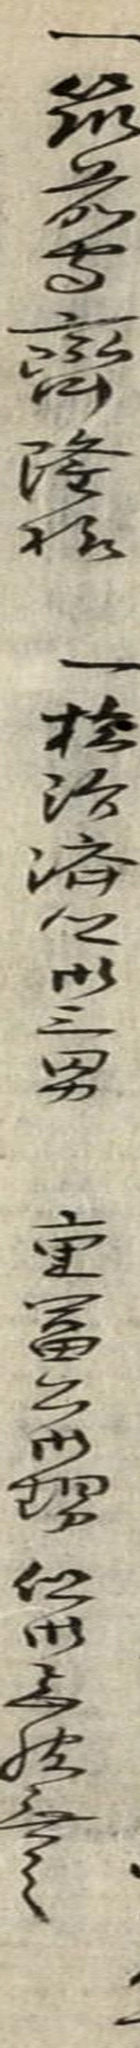一筑前守斉隆様一橋治済卿御三男重富公御甥但御忌服無之
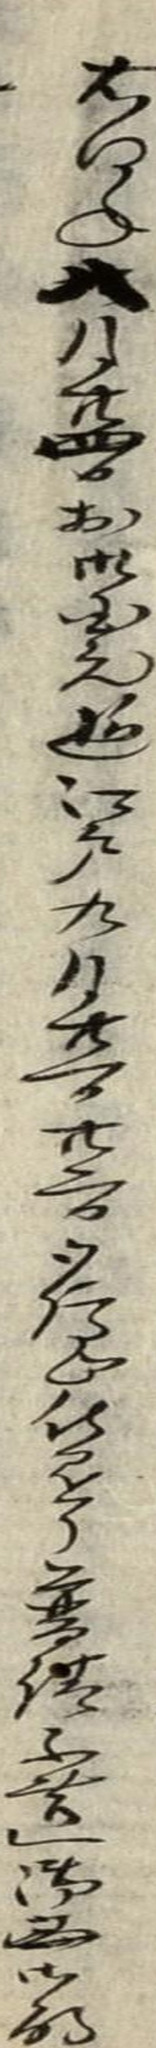右同年八月廿四日於御国元逝江戸九月廿一日廿二日御停止仕懸り普請不苦」御国御触
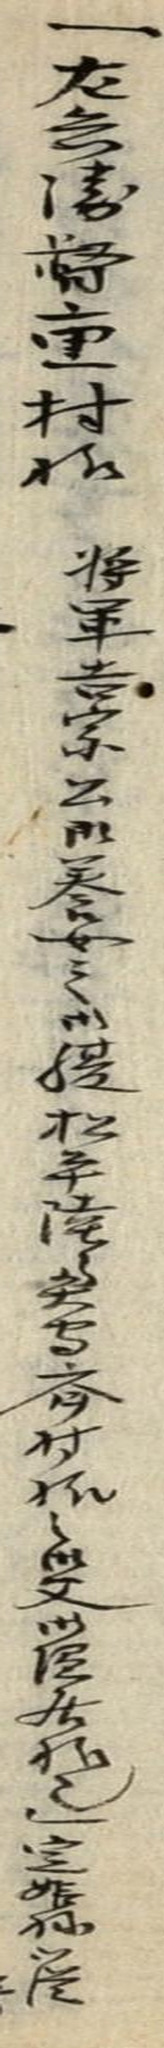一左兵衛督重村様将軍吉宗公之御養女之御腹松平陸奥守斉村様之御父御隠居様也」定姫様御従弟
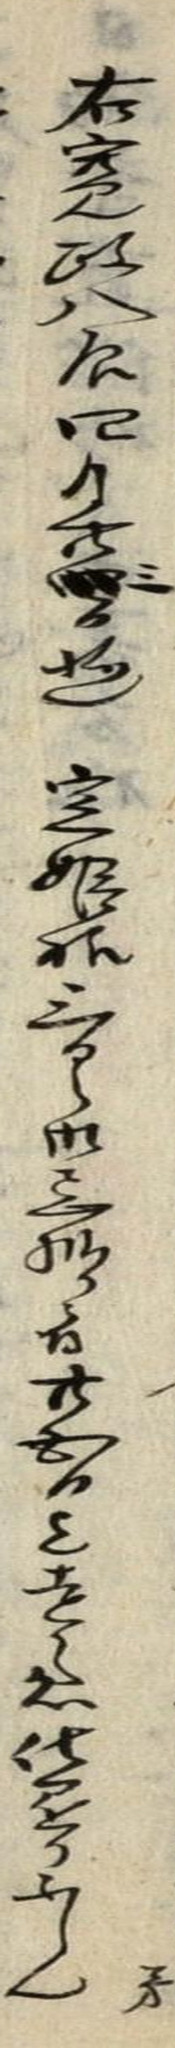右寛政八辰四月廿三日逝定姫様三日之御忌掛りに付廿五日迄遠慮仕懸りふしん
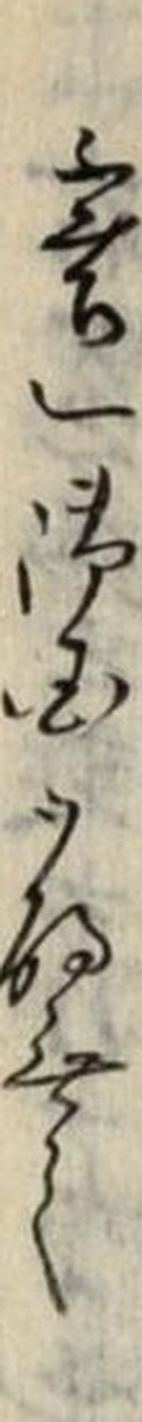不苦」御国御触無之
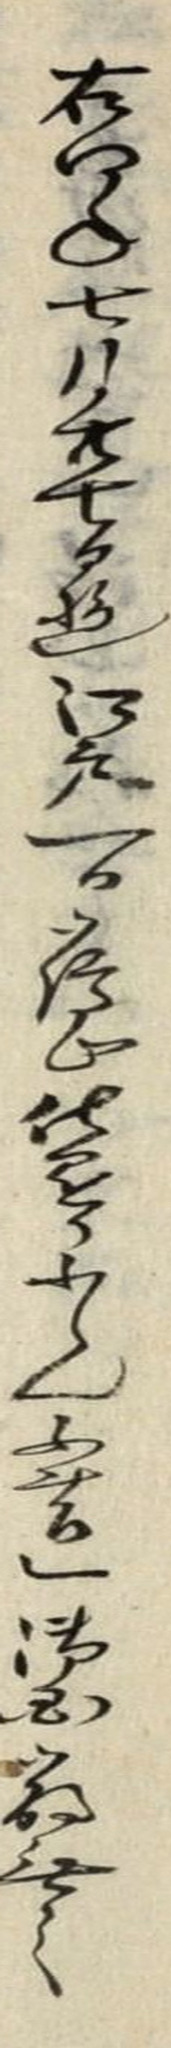右同年七月廿七日逝江戸一日御停止仕懸りふしん不苦」御国御触無之
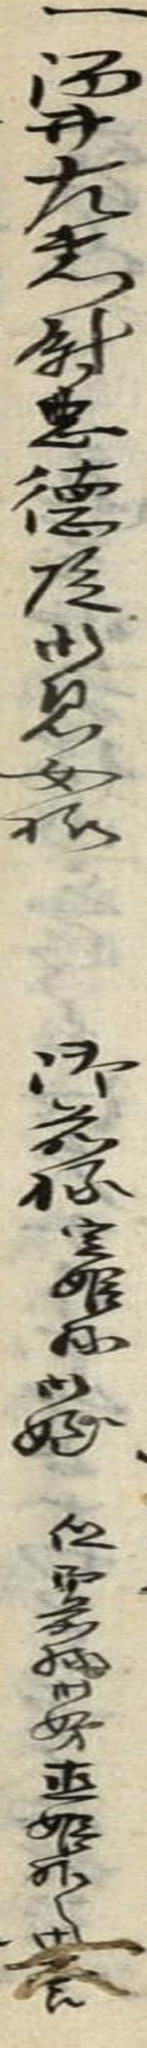一酒井左衛門尉忠徳殿御息女様御前様定姫様御姪但御前様御姉直姫様之御養ナリ
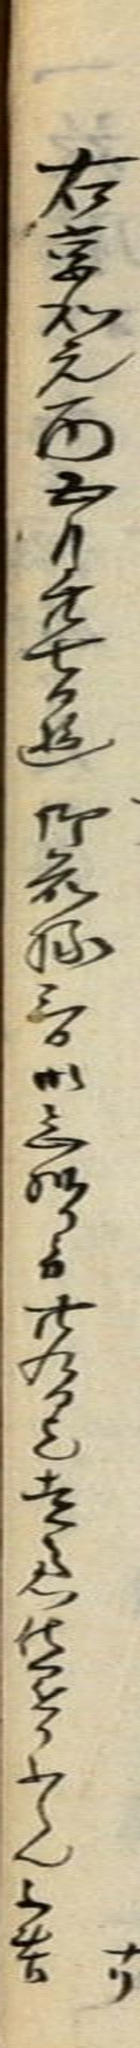右享和元酉五月廿七日逝御前様三日御忌掛りに付廿九日迄遠慮仕懸りふしん不苦
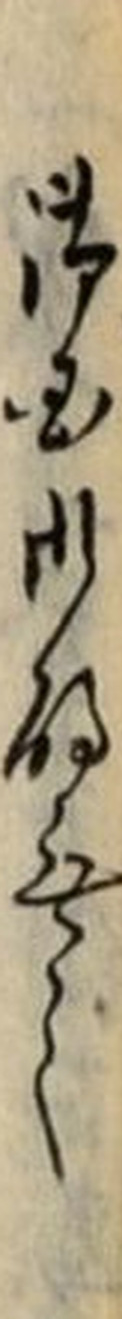御国御触無之
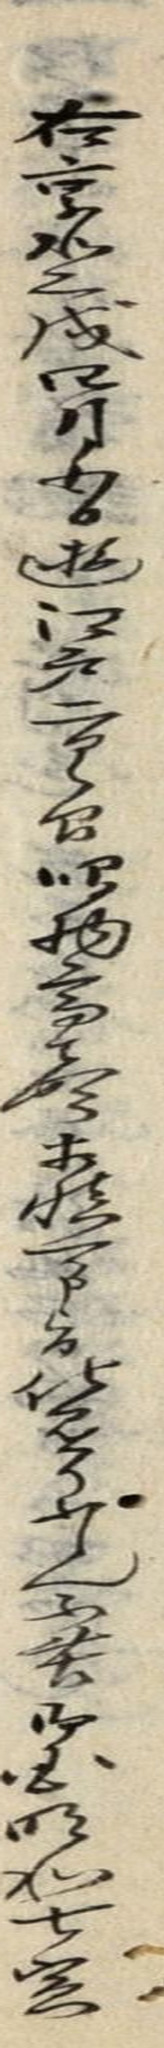右享和二戌四月五日逝江戸二日之間鳴物高声相慎可申旨仕懸りふしん不苦御国明和七寅
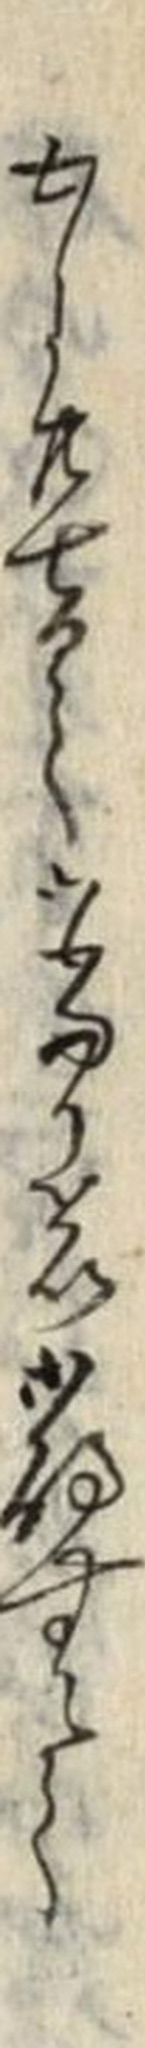五月廿七日之御当りを以御触無之
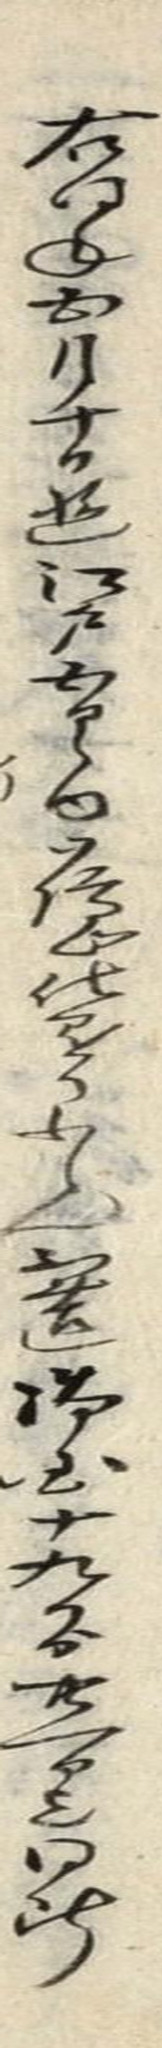右同年五月十日逝江戸五日之内御停止仕懸りふしん不苦」御国十九日ゟ廿一日迄同断
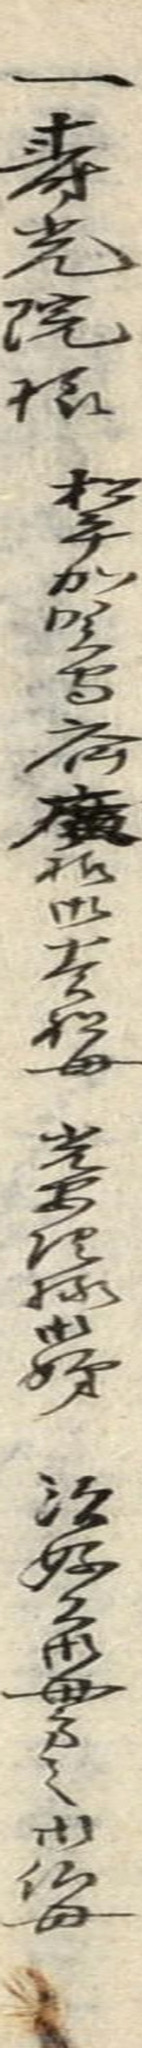一寿光院様松平加賀守斉広様御養祖母光安院様御姉治好公御母方之御伯母
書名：御停止異変死失
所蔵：福井県文書館 Fukui Prefectural Archives
